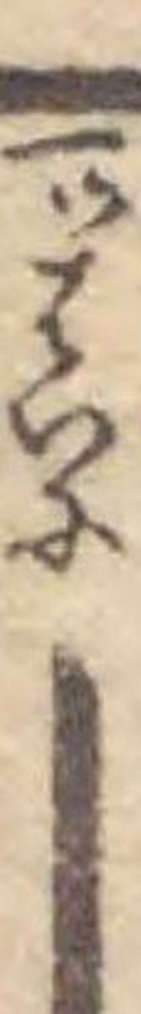一ッはいに
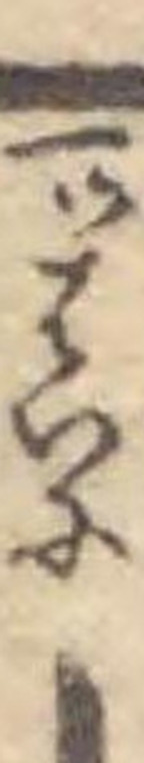一ッはいに
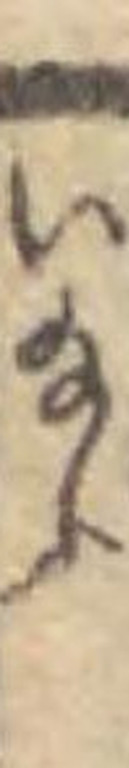い給ふ
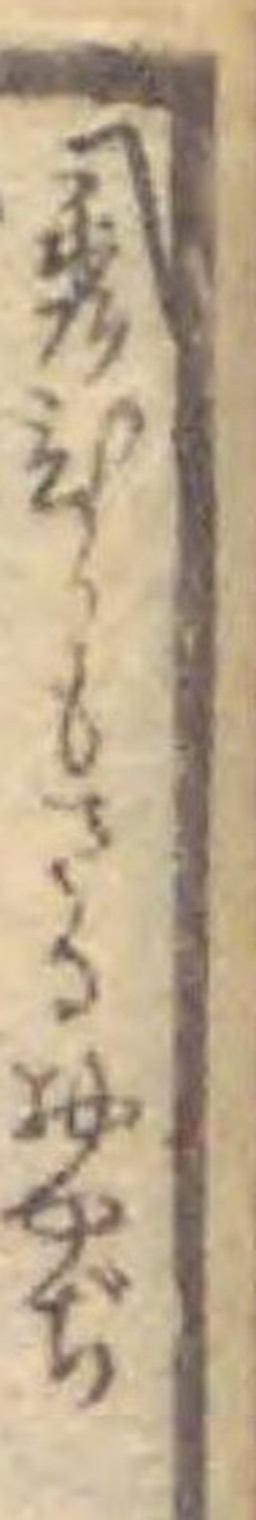〽秀ひらもさるおやぢ
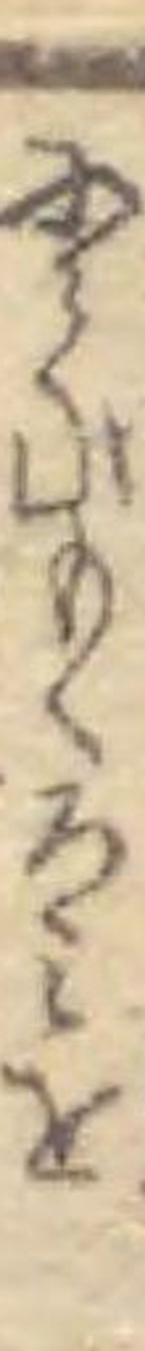にて此もくろみを
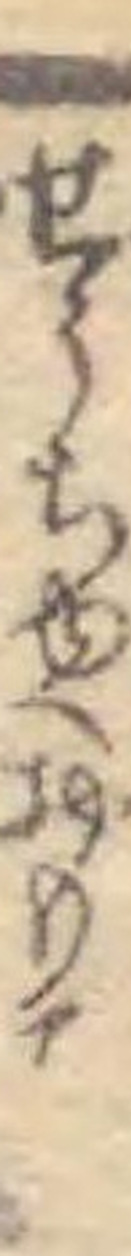せうちゆへおもて
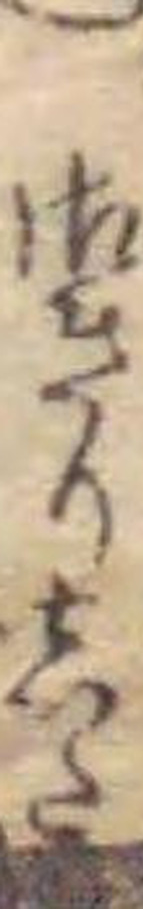御きりした
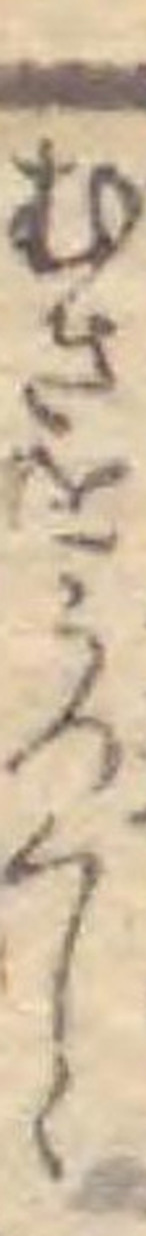むきをうつくしく
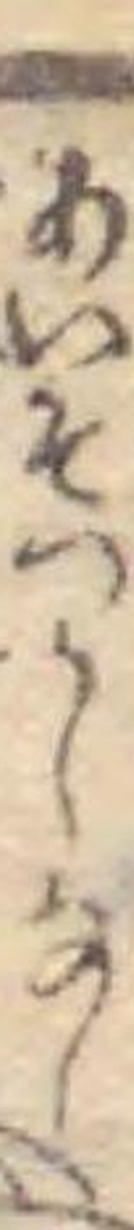あいそつかしなし
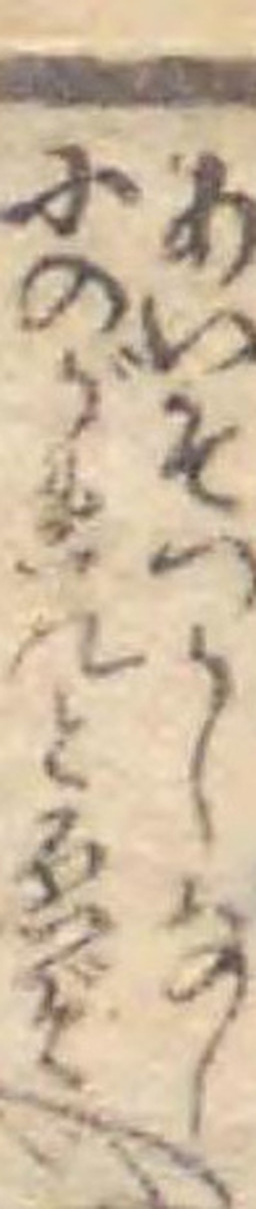にのがれんとゑぞ
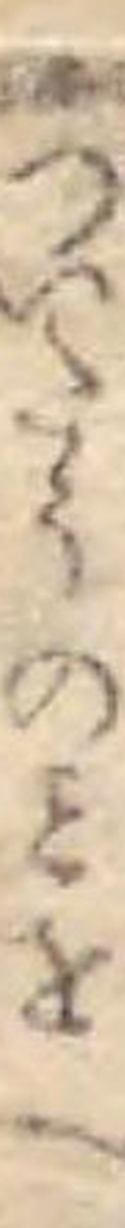ついたうのことを
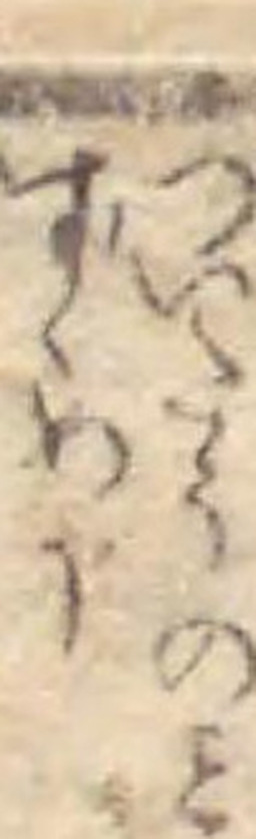すゝめ申
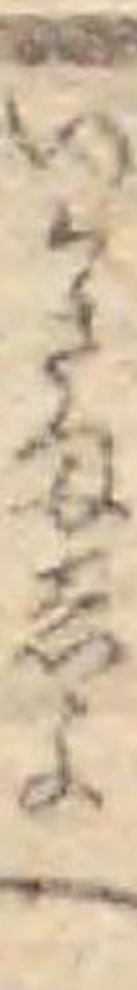いかさましよ
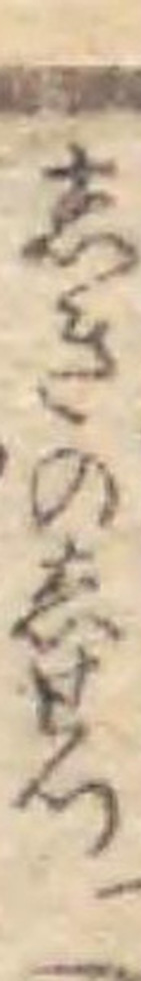しきのしせつ
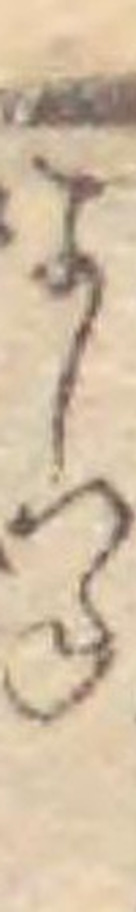よしつね
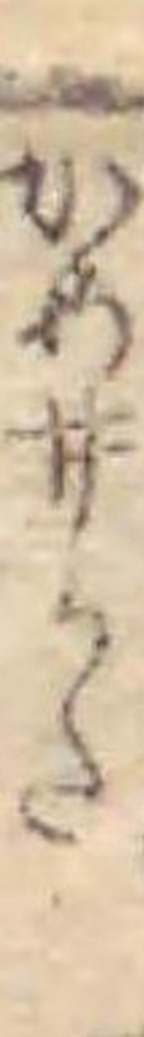かめ井かた
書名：悦贔負蝦夷押領 : 3巻
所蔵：国立国会図書館 National Diet Library, JAPAN
